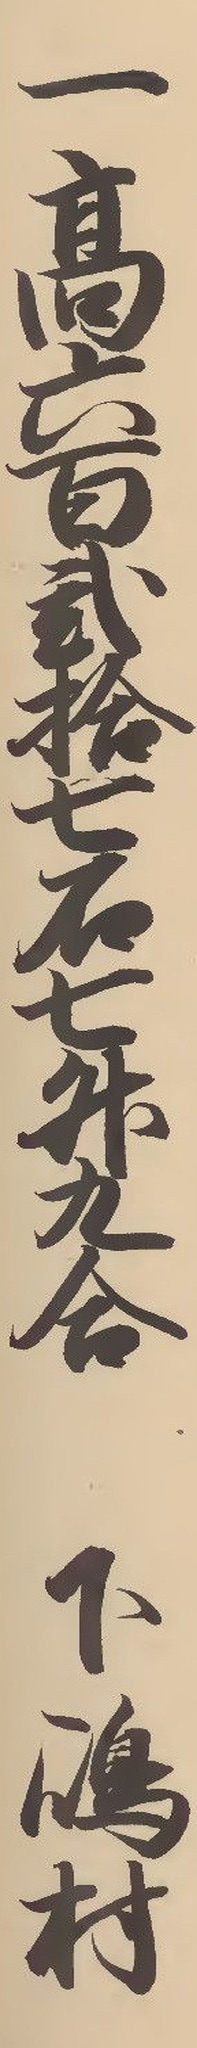一高六百弐拾七石七升九合下島村
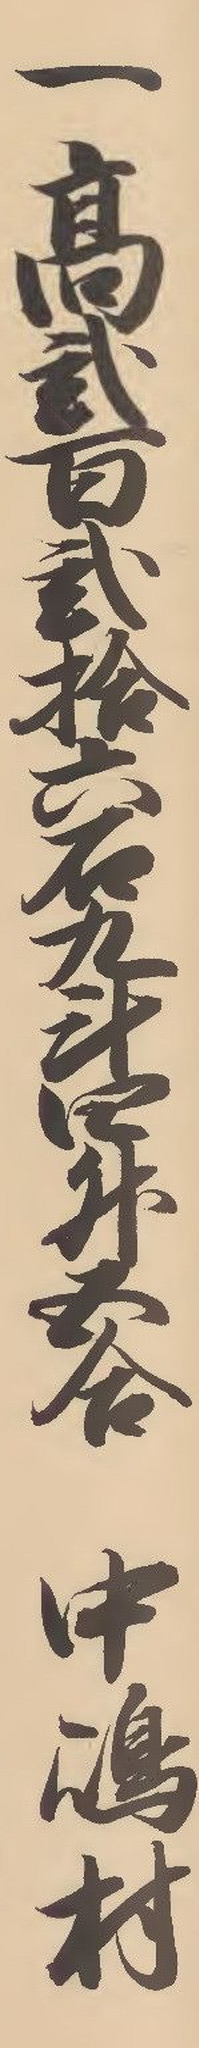一高弐百弐拾六石九斗四升五合中島村
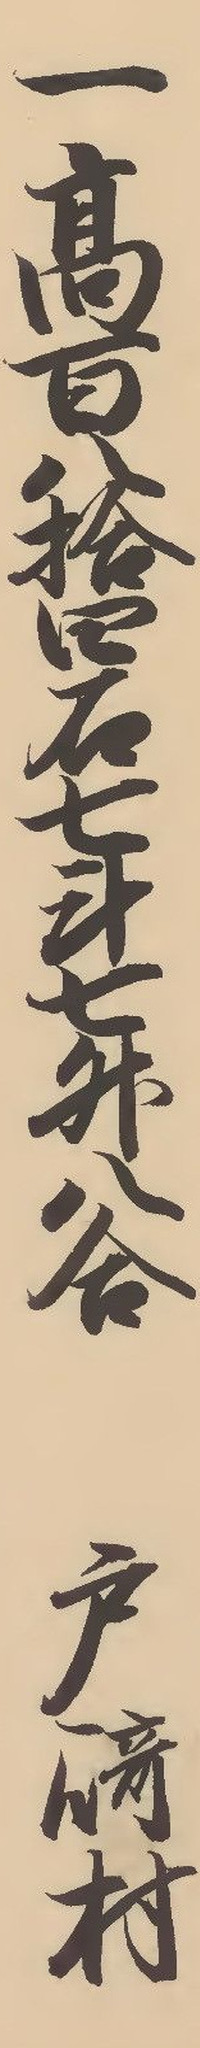一高百八拾四石七斗七升八合戸崎村
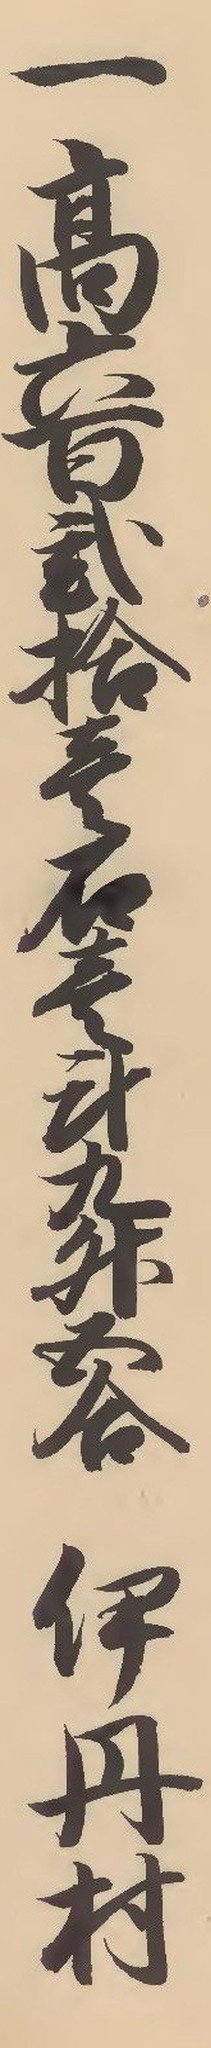一高六百弐拾壱石壱斗九升五合伊丹村
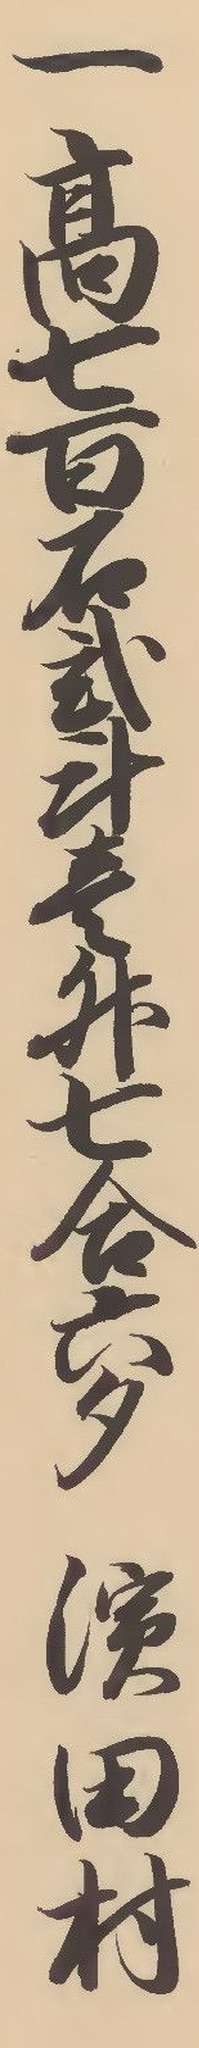一高七百石弐斗壱升七合六勺浜田村

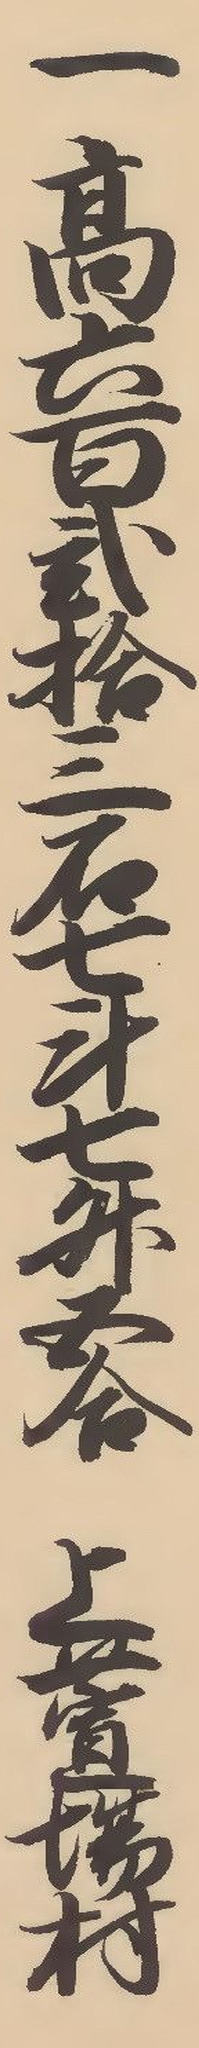一高六百弐拾三石七斗七升五合上萱場村
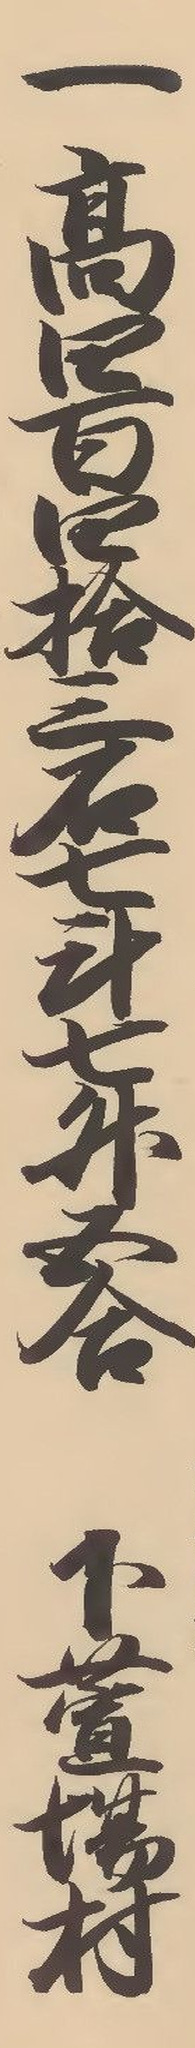一高四百四拾三石七斗七升五合下萱場村
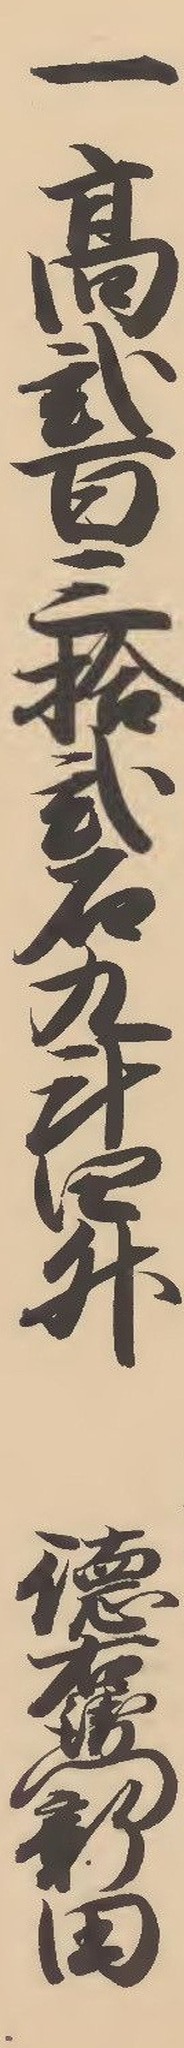一高弐百三拾弐石九斗四升徳右衛門新田
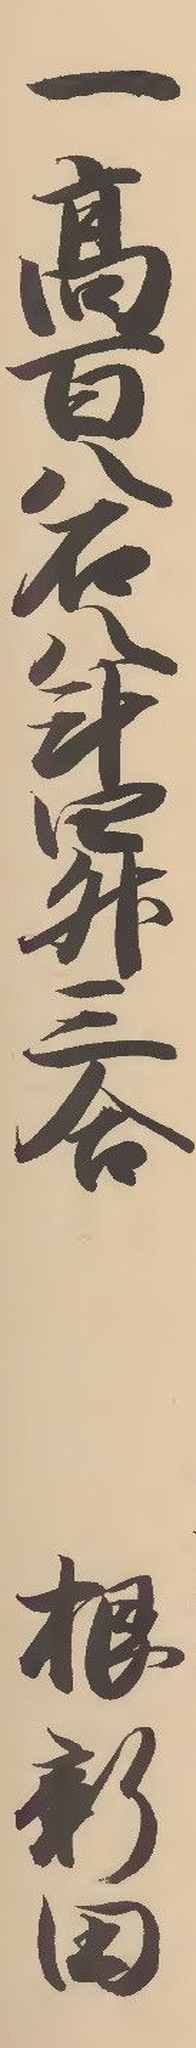一高百八石八斗四升三合根新田
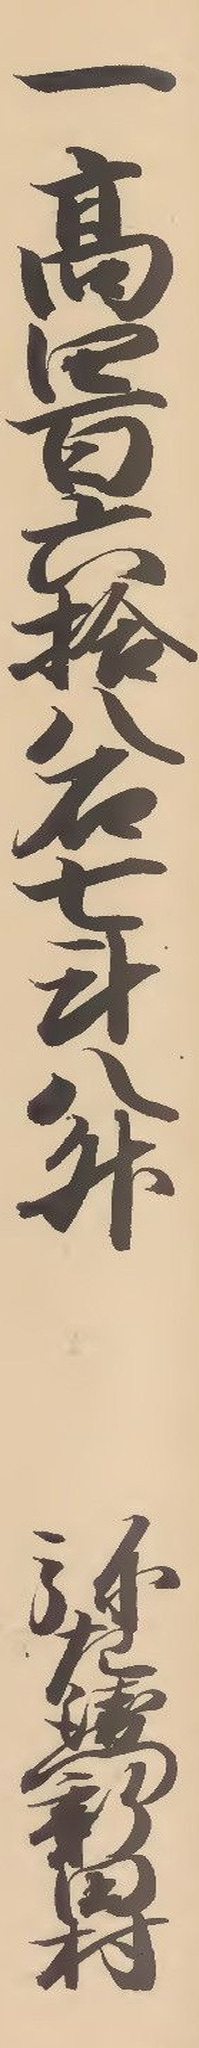一高四百六拾八石七斗八升弥左衛門新田村
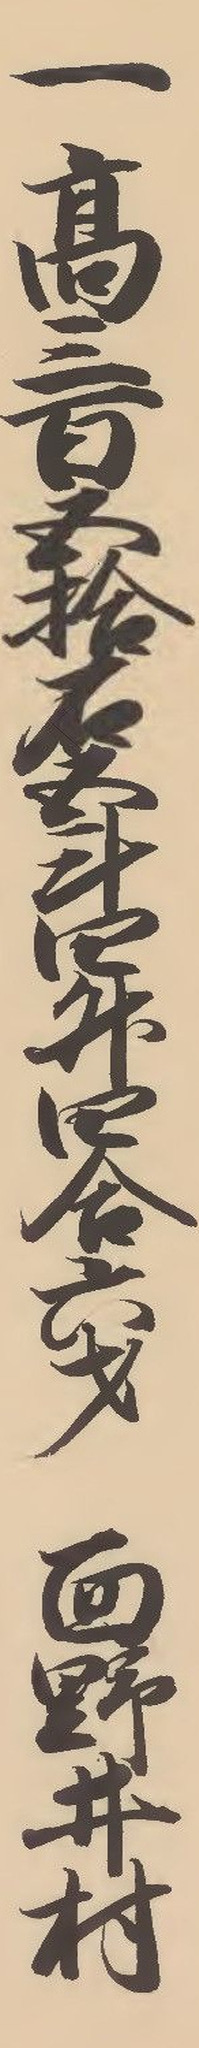一高三百五拾石五斗四升四合六才面野井村
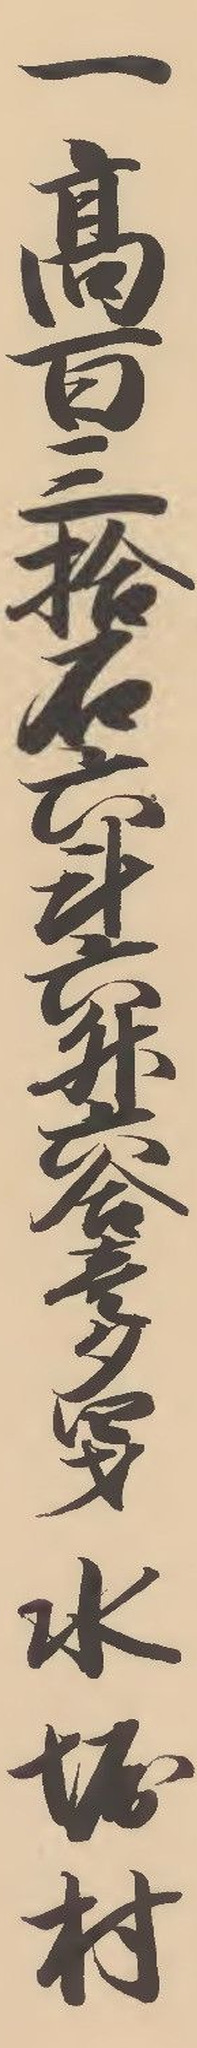一高百三拾石六斗六升六合壱勺四才水堀村
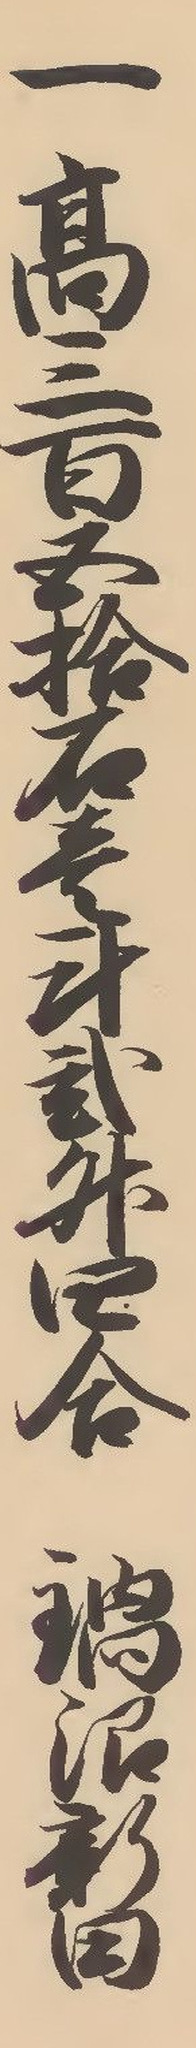一高三百五拾石壱斗弐升四合鍋沼新田

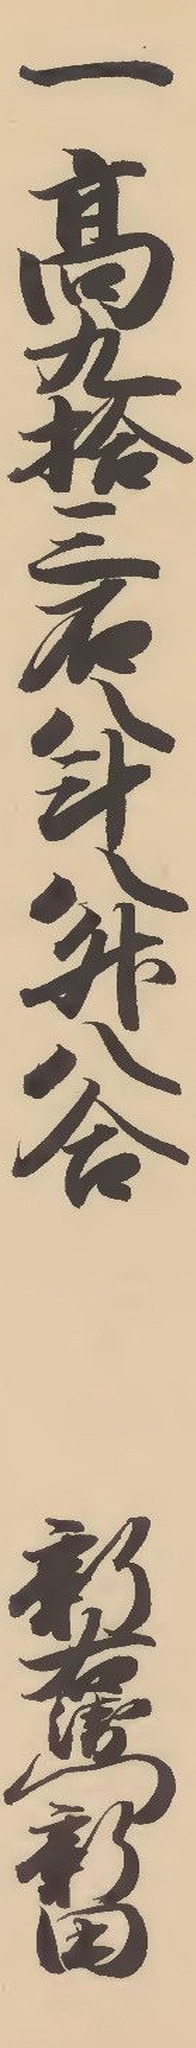一高九拾三石八斗八升八合新右衛門新田
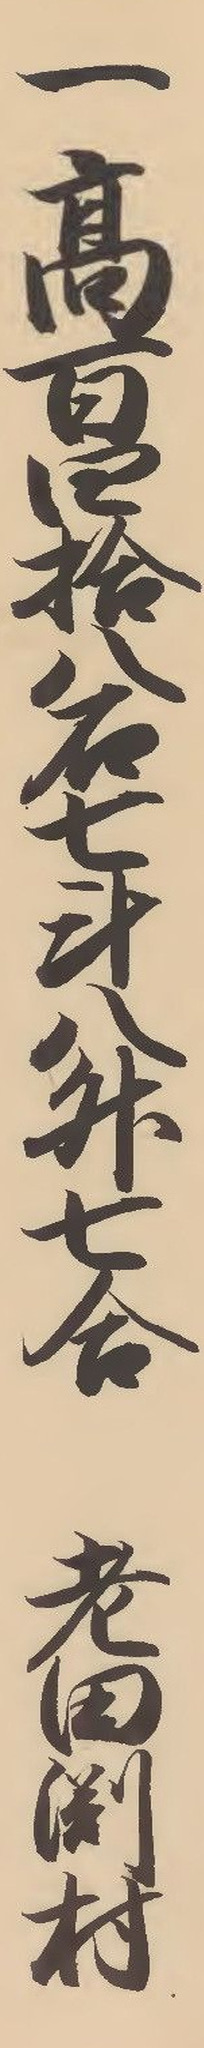一高百四拾八石七斗八升七合老田淵村
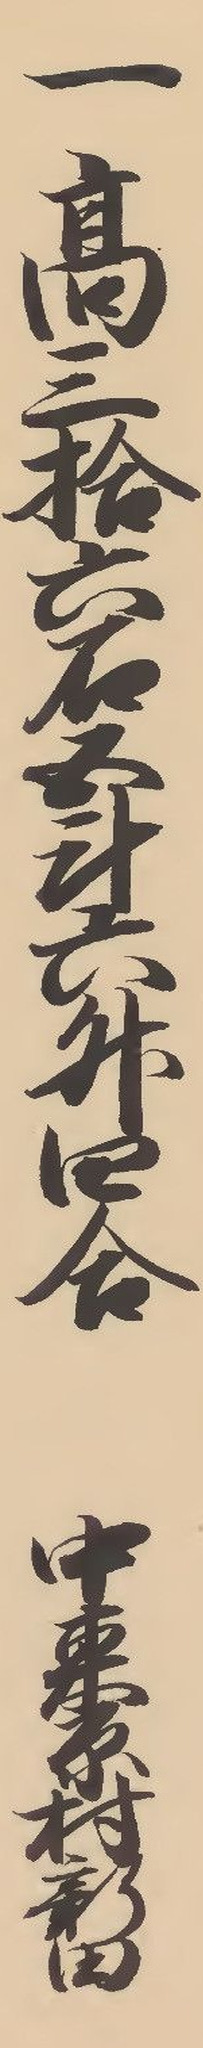一高三拾六石五斗六升四合中東原村新田
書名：常陸国郷帳
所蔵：国立公文書館 National Archives of Japan
